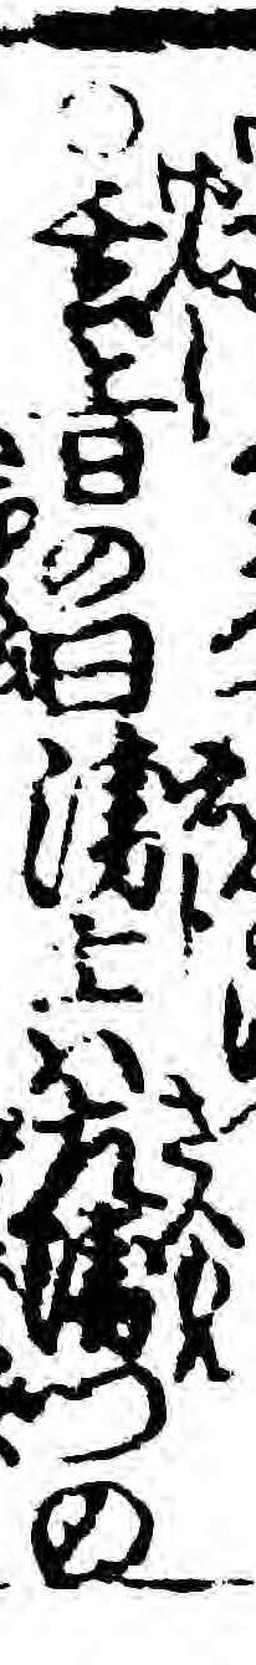〇玄旨の曰衛士は左衛門の
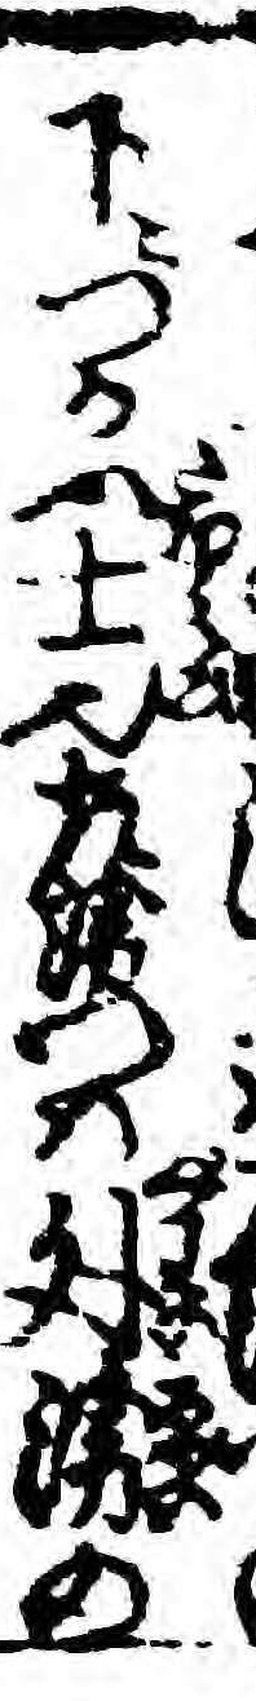下につかふ士也左衛門は外衛の
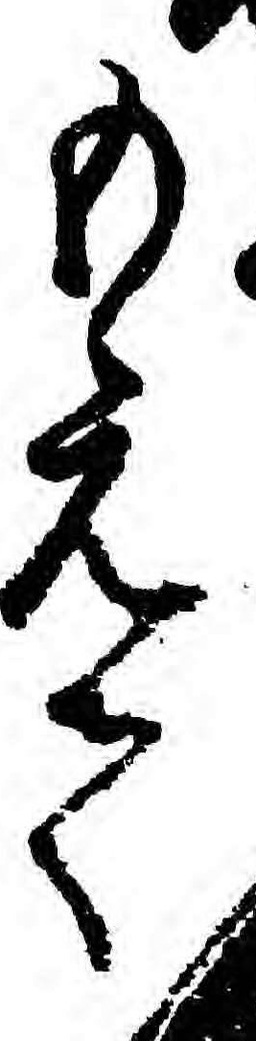もえて
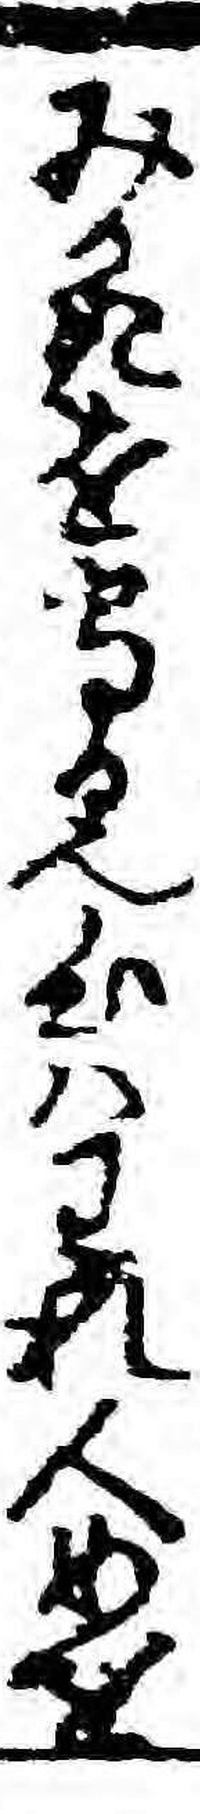みかきを守る也心はわれ人めを
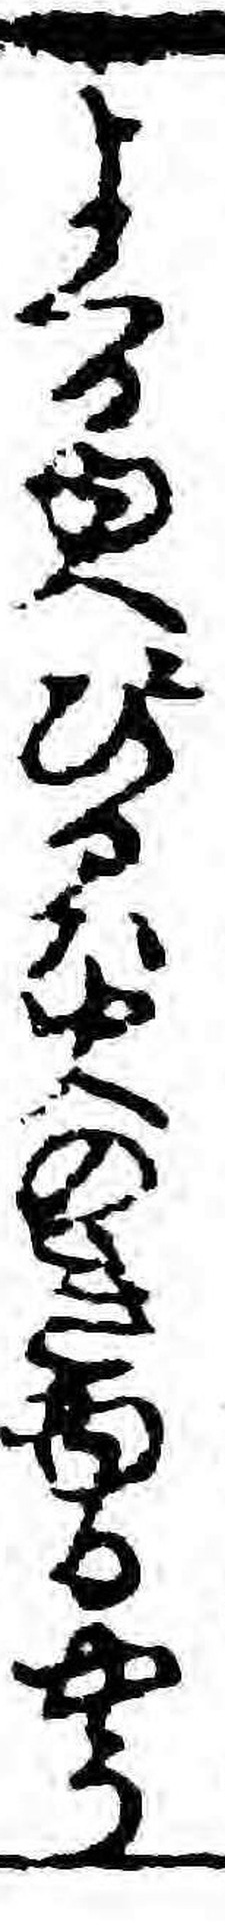よくるゆへにひるは火のきゆるやう
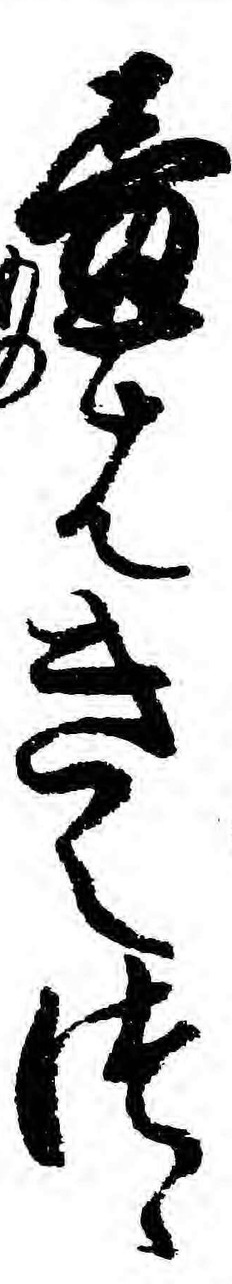昼はきえつゝ
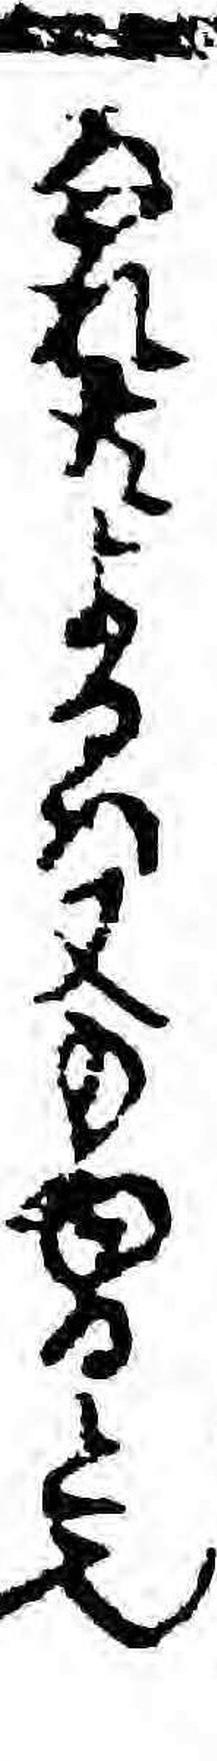なれ共よるは又もゆると也
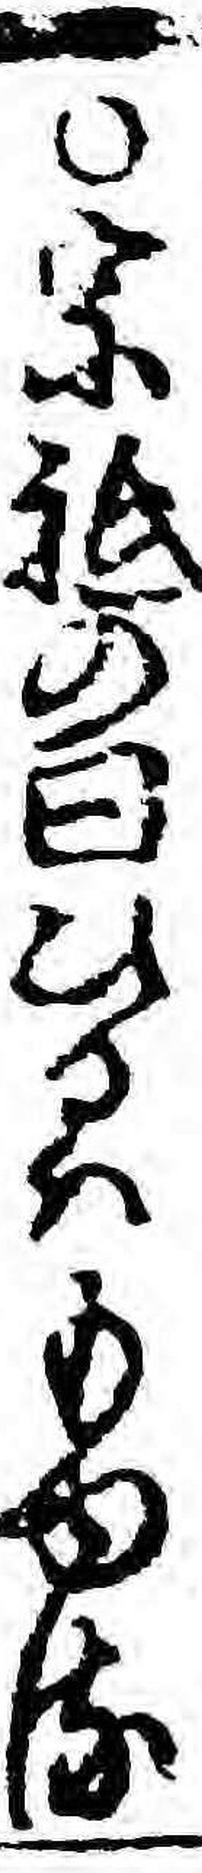〇宗祇の曰ひるはもゆる
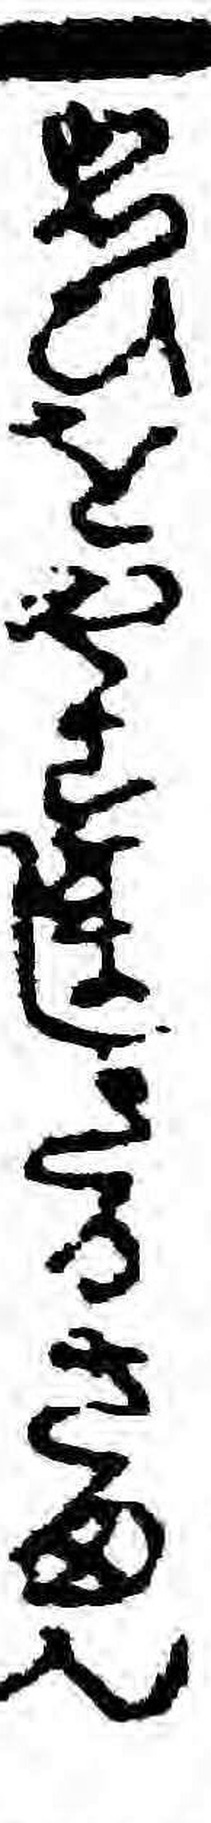思ひをやすましたるさま也
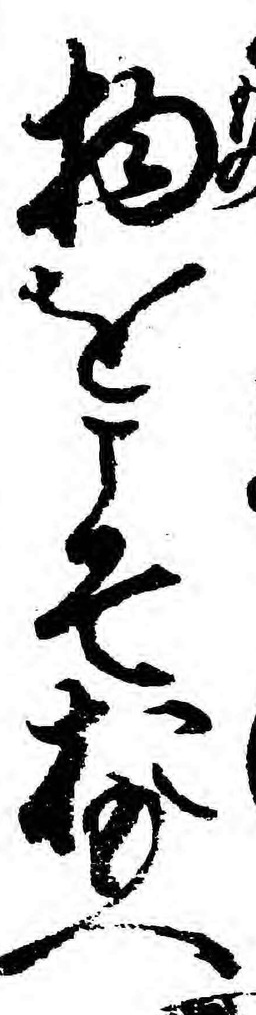物をこそおもへ

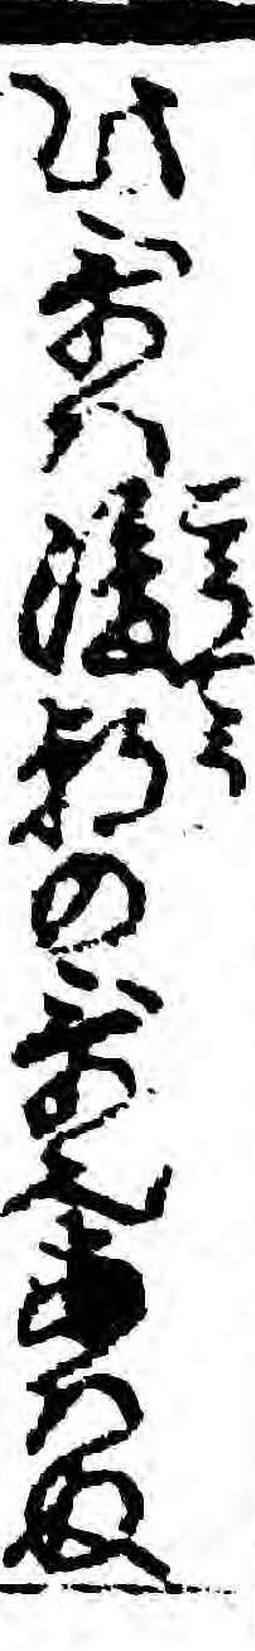此哥は後朝の哥也あはぬ
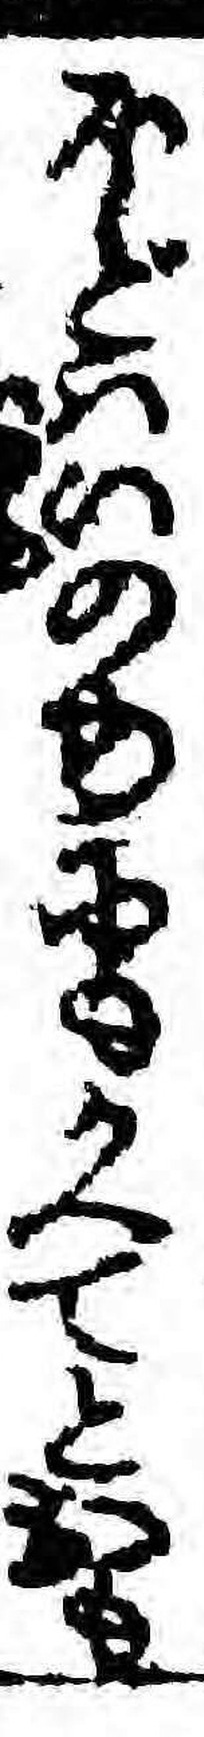ほどはいのちにもかへてとおも
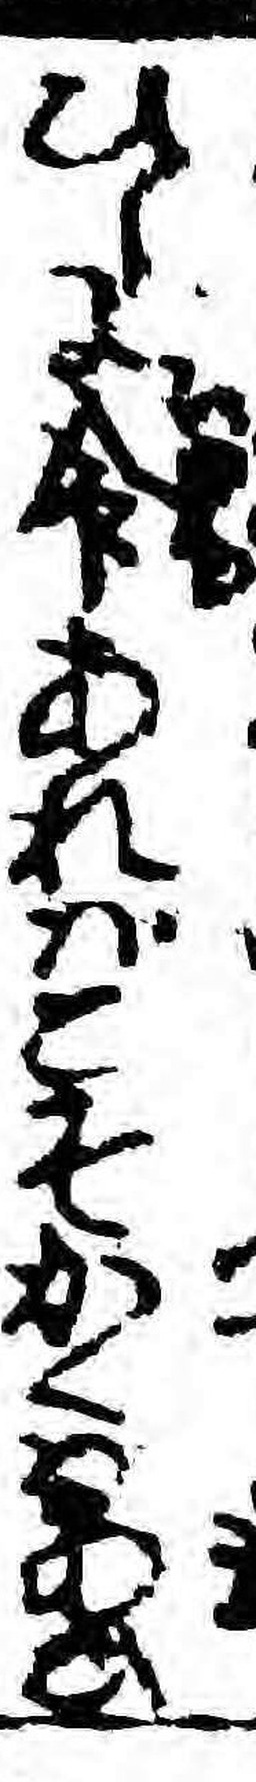ひしに命あればこそかくはあひ
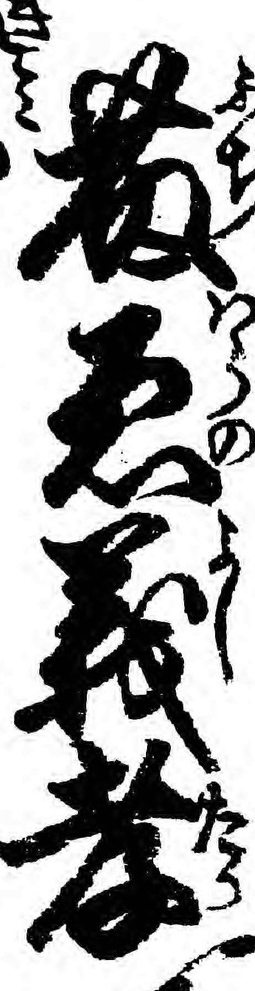藤原義孝
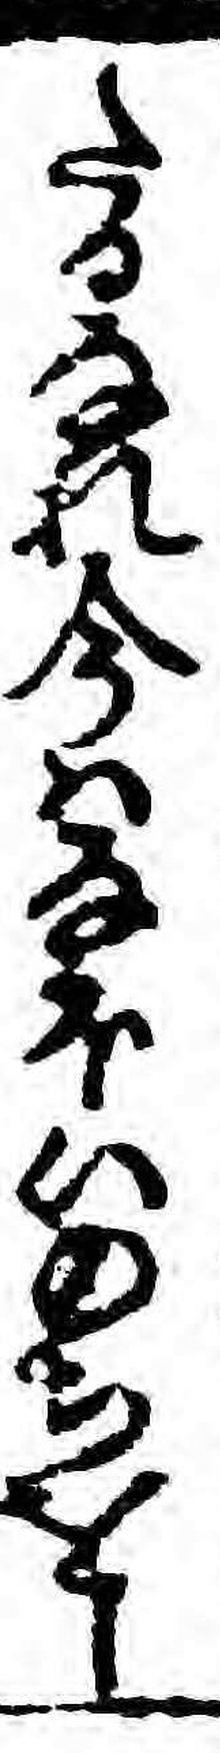たるなれ今はなほいのちをし
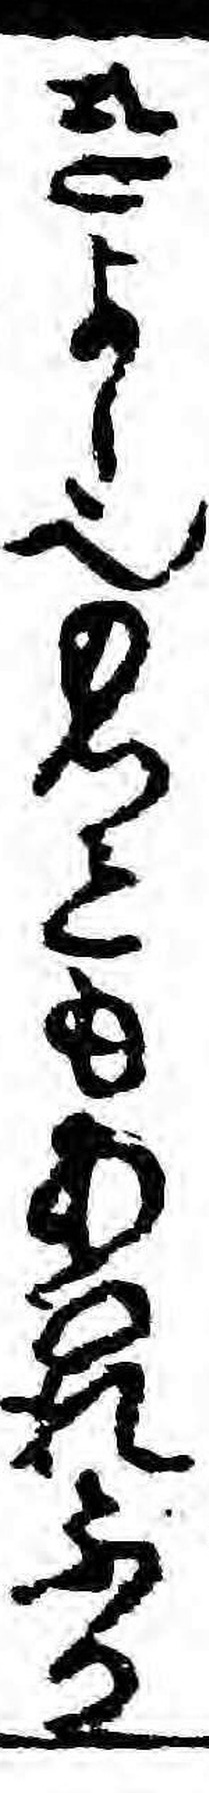きよし也もつともあはれふか
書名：頭書和歌注譯／壽賀多百人一首小倉錦
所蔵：国文学研究資料館
